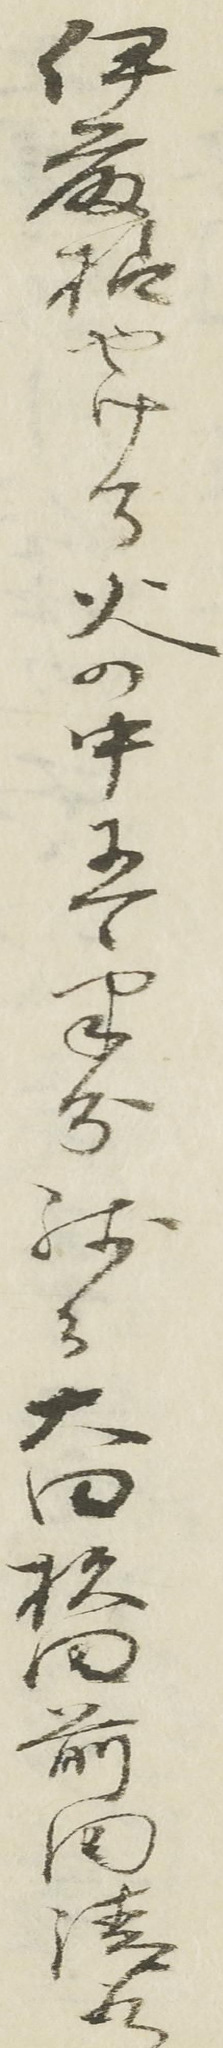伊藤様やける火の中にて半分残る大田杉田前田清水
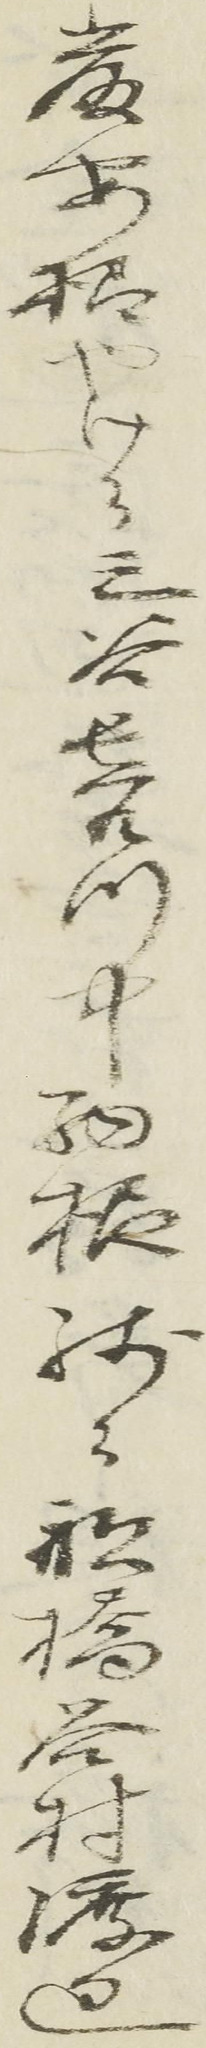厳安様やける三谷長谷川中西様残る船橋谷村渡辺
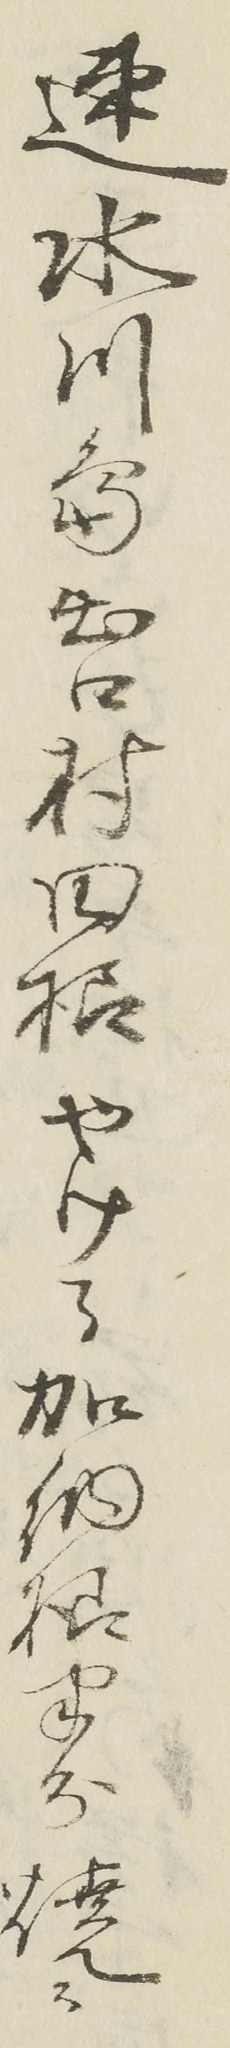速水川島出口村田様やける加納様半分焼る
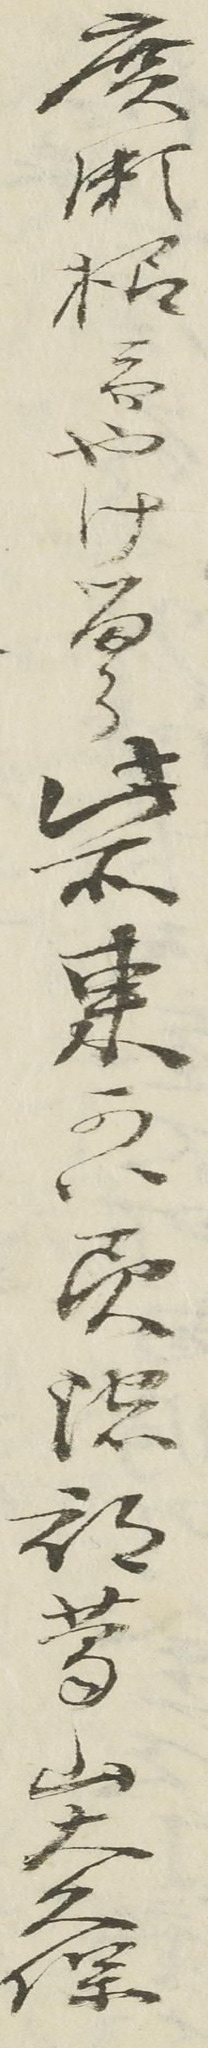廣瀬様やけ留る此所東かハ員認部夢山大久保
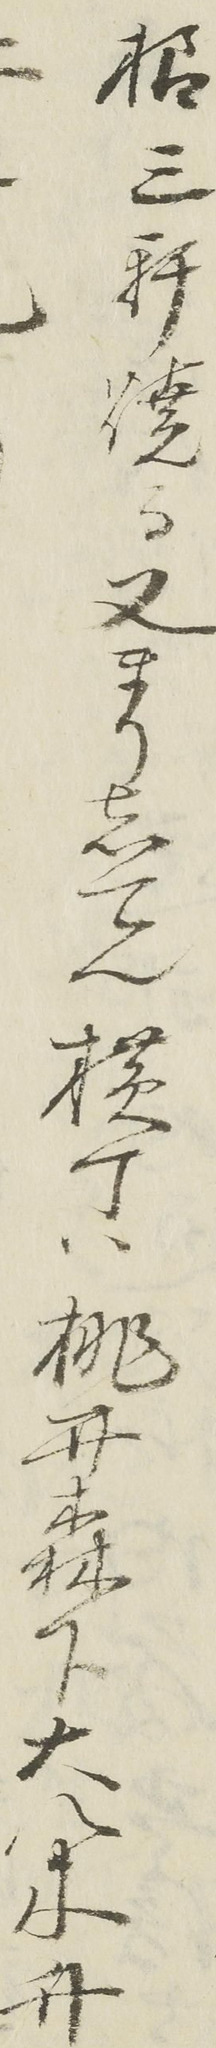様三軒焼る又まりしてん横丁ハ桃井森下大八木井
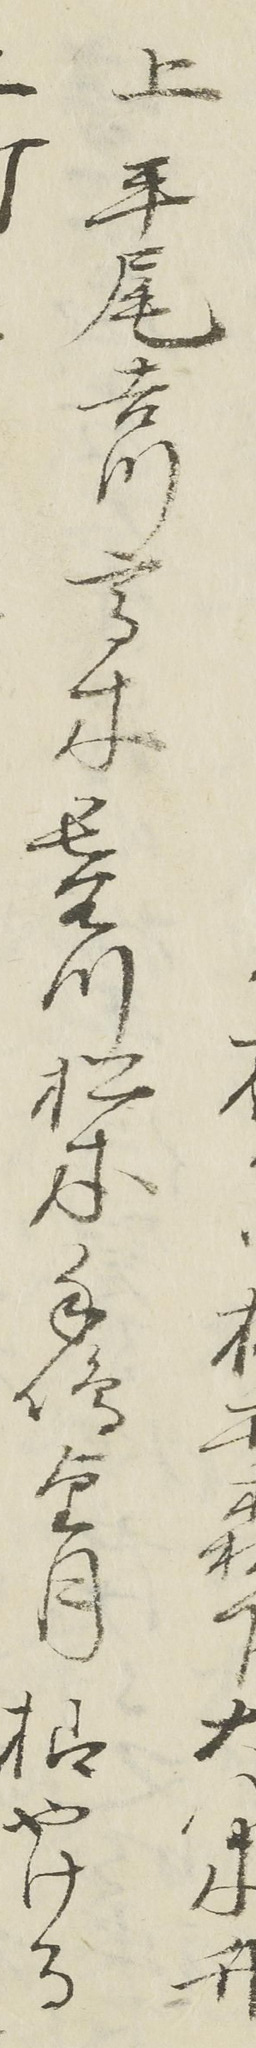上平尾𠮷川高木長谷川松本手嶋望月様やける
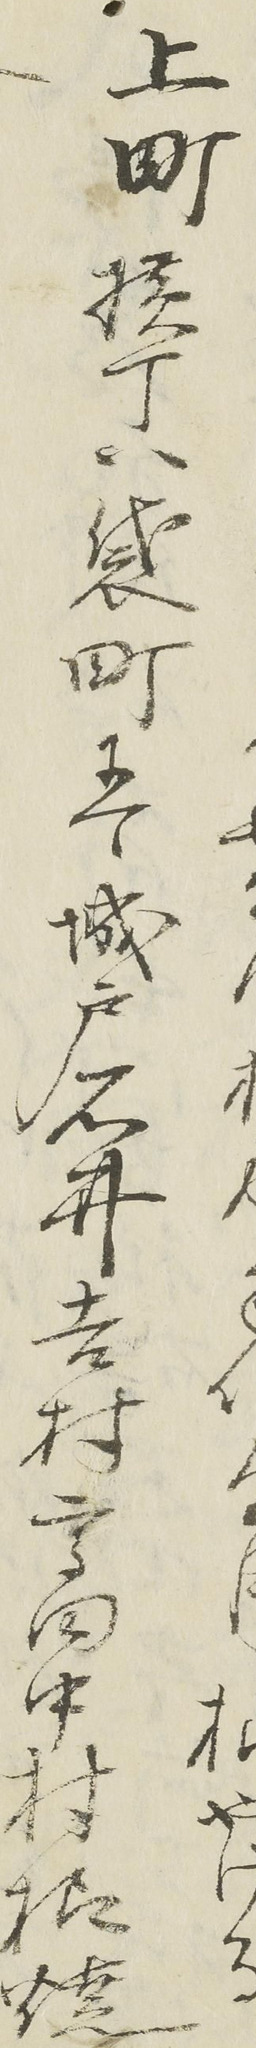上町横丁ハ袋町にて城戸石井吉村高田中村様焼
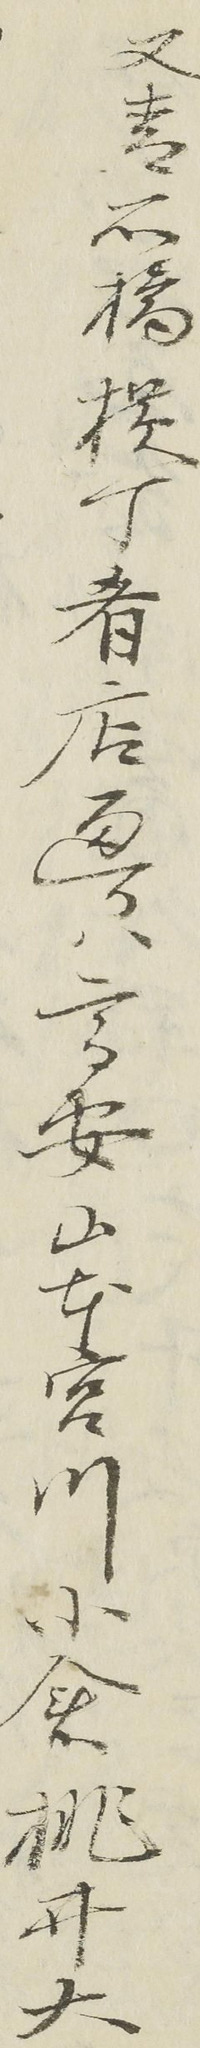又青石橋横丁者店通りハ高安山本宮川小倉桃井大
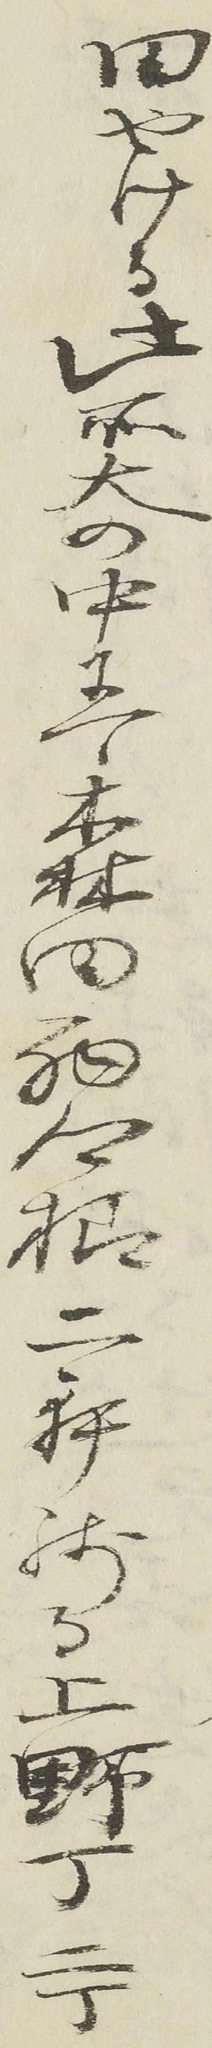やける田此所大の中にて森田西郷様二軒残る上野丁ニ丁
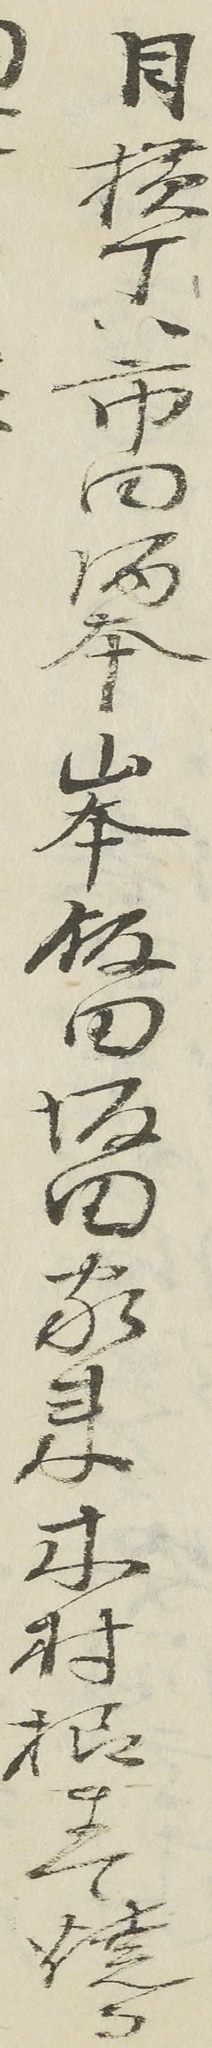目横丁ハ市田酒本山本飯田坂田家来木村様まで焼る
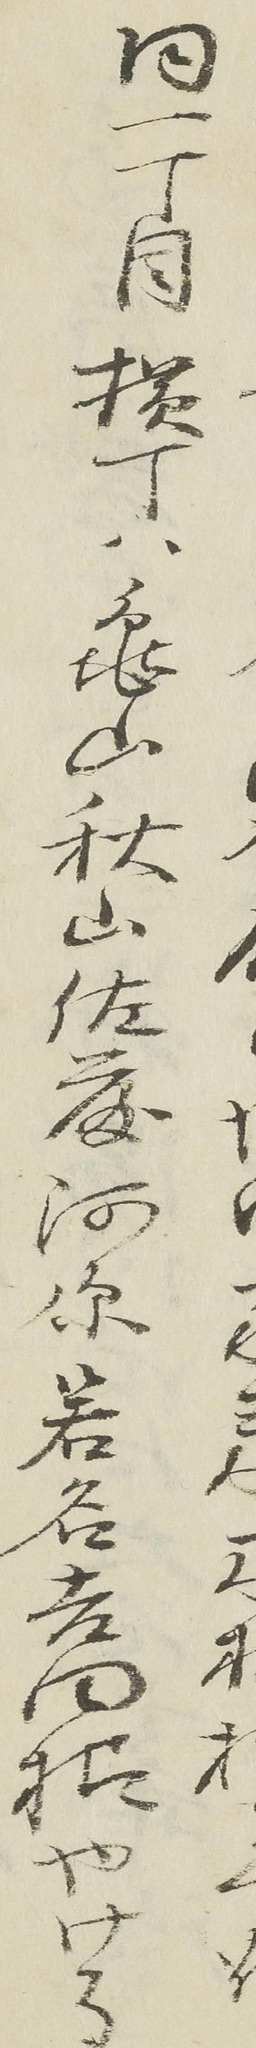同一丁目横丁ハ亀山秋山佐藤河原若名吉田様やける
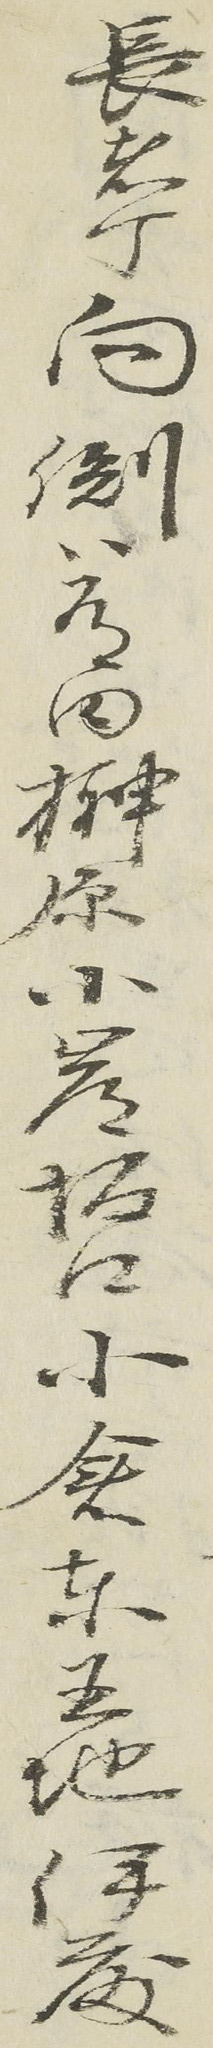長者丁向側ハ有田榊原小岸坂口小倉東王地伊藤

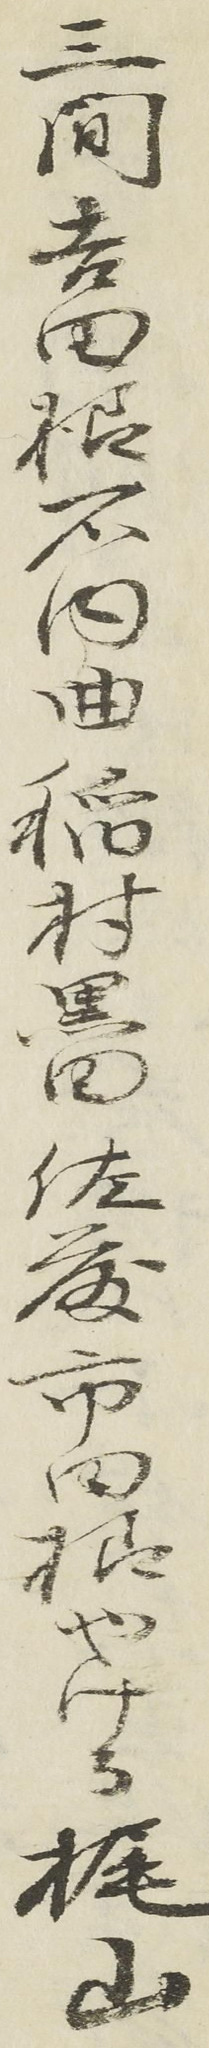三間吉田様石内曲稲村黒田佐藤市田様やける梶山
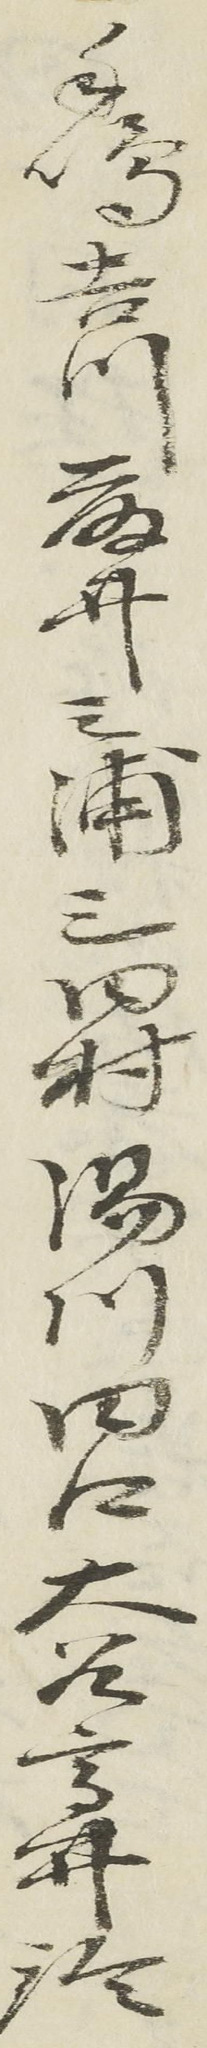手嶋吉川藤井三浦三田村湯川田口大谷高井鈴
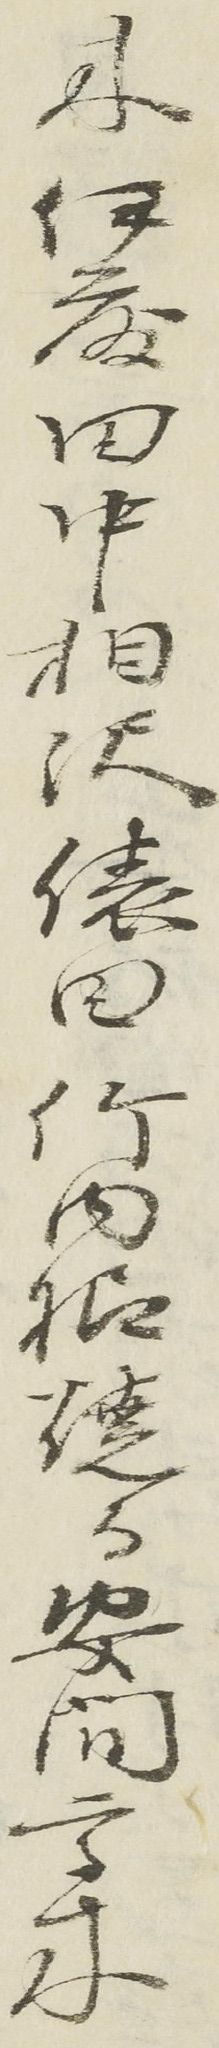木伊藤田中相沢俵田竹内様焼る安間高木
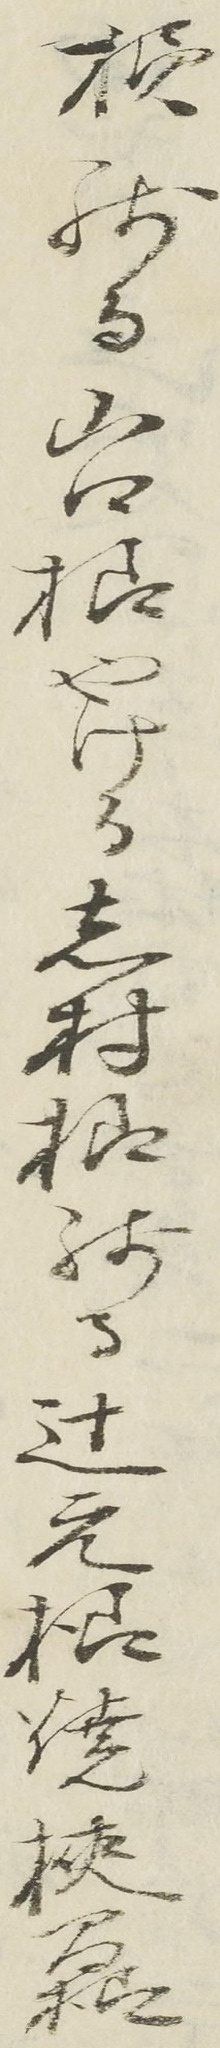様残る山口様やける志村様残る辻元様焼狭間様
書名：安政乙卯江戸大地震筆記　安政丙辰八月大阪大雷雨之記追加　安政三辰年七月松前辺大地震并八月大風雨記録
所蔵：東京大学地震研究所図書室 Earthquake Research Institute Library, The University of Tokyo, JAPAN
